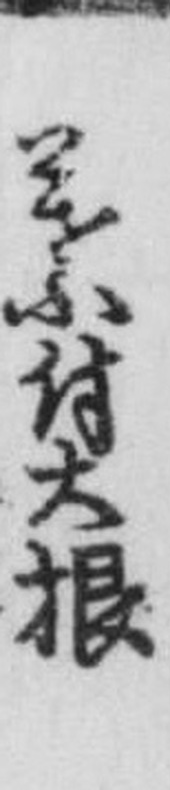葉付大根
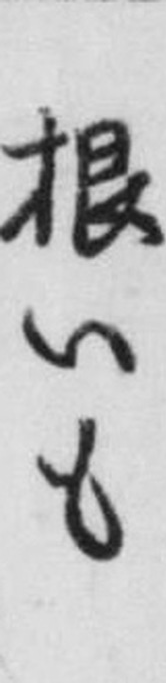根いも
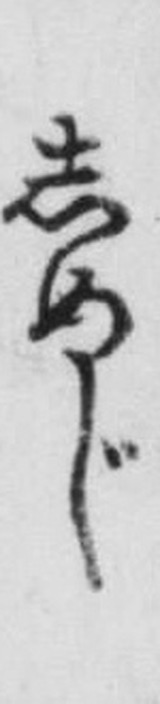しめじ
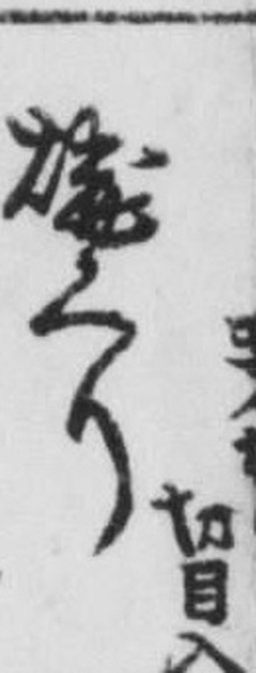焼くり
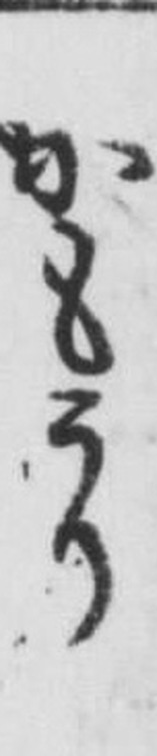かもうり
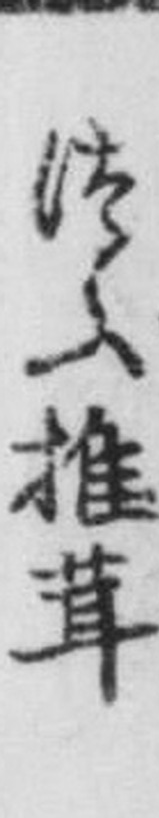つぶ椎茸
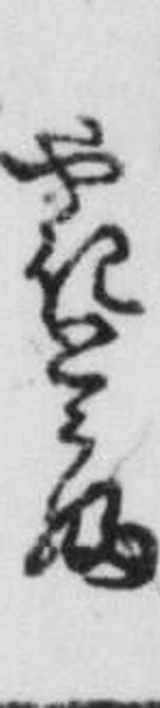やきとうふ
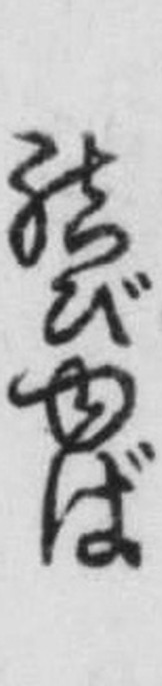結びゆば
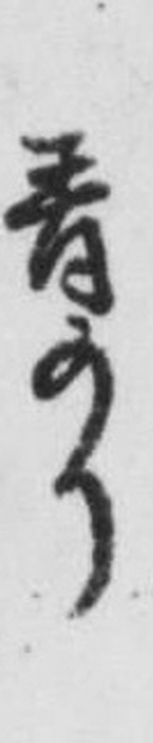青のり
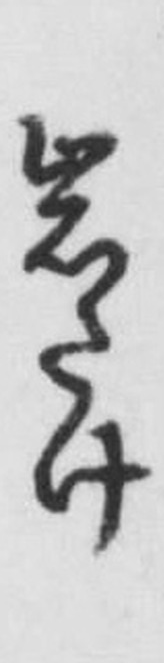岩たけ
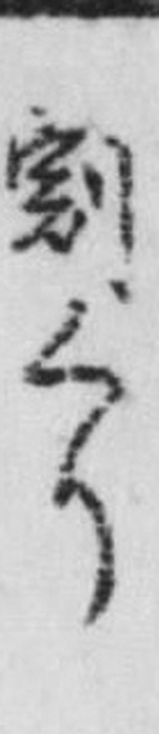割くり
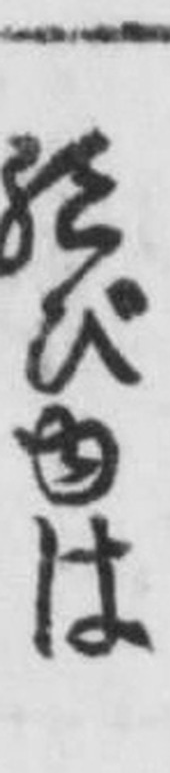結びゆは
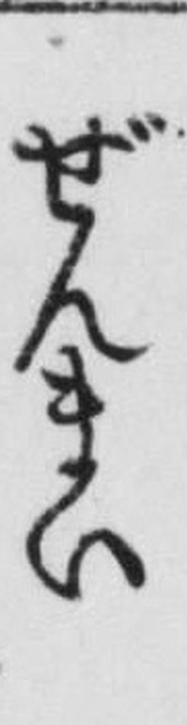ぜんまい
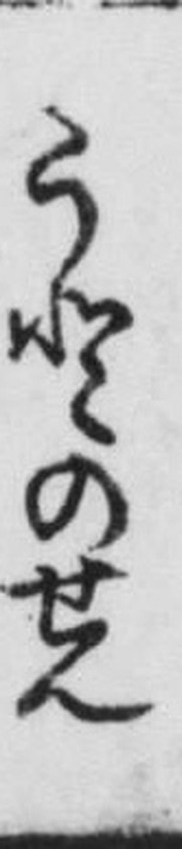うとのせん
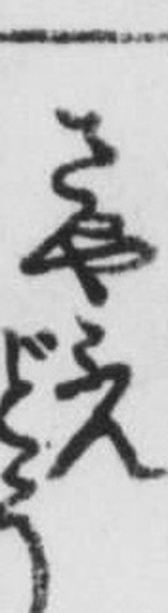さやふん
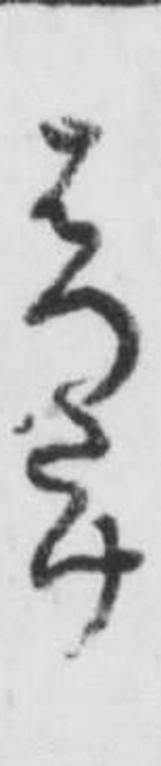はつたけ
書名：精進魚類間合料理/早速庖丁
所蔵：大阪府立大学学術情報センター 国文学研究資料館
